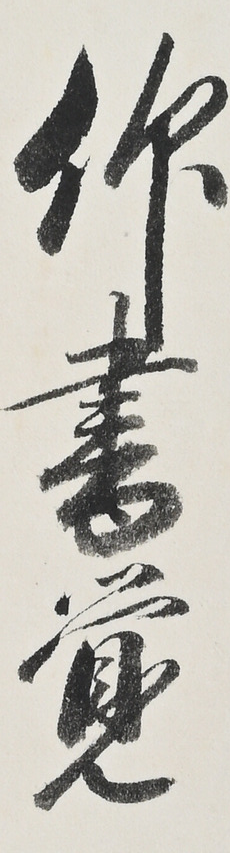仰書覚
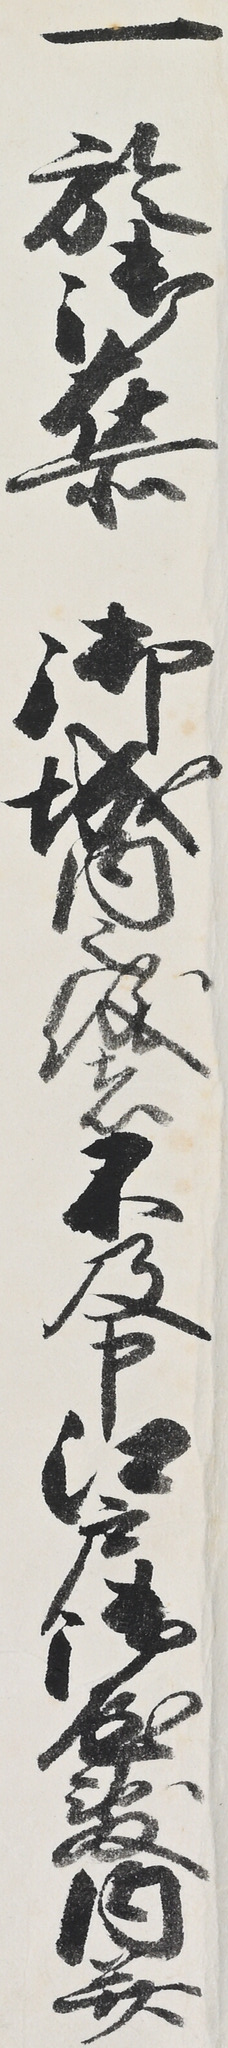一於御在所御城内之儀者不及申江戸御屋敷内幷
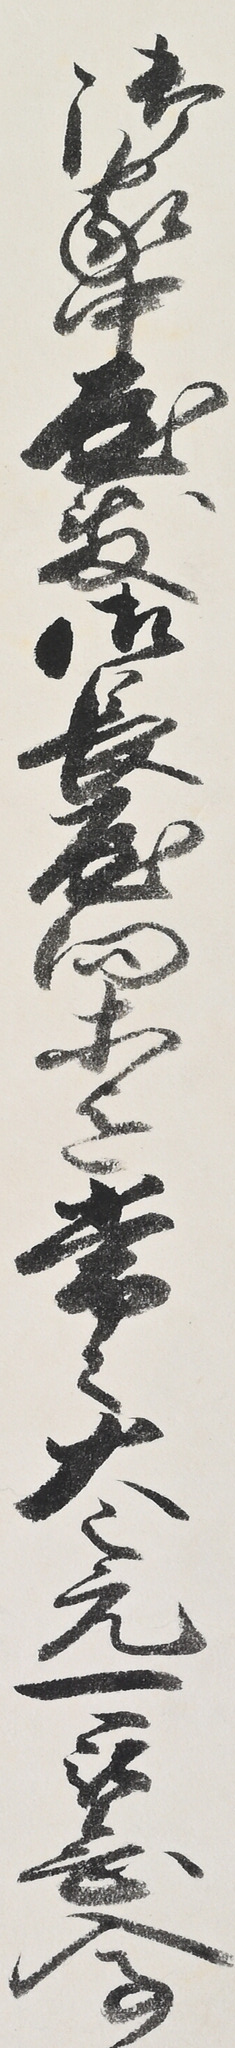御家中屋敷御長屋向等迄常々火之元可被念入事
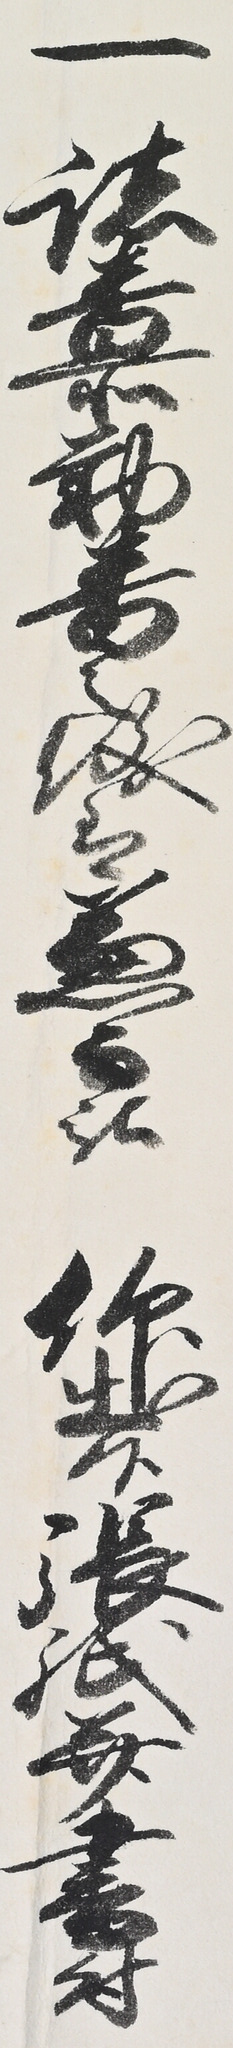一諸番所勤番之儀は兼而被仰出候張紙幷書付
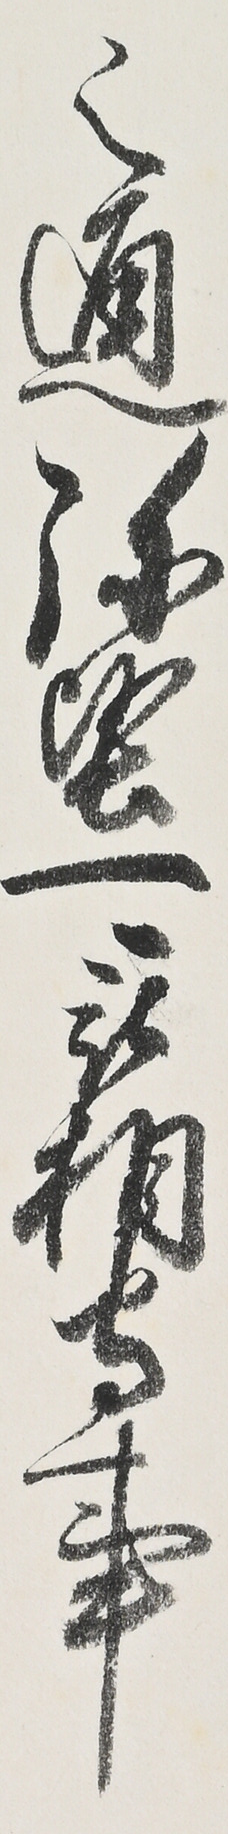之通弥堅可被相守事
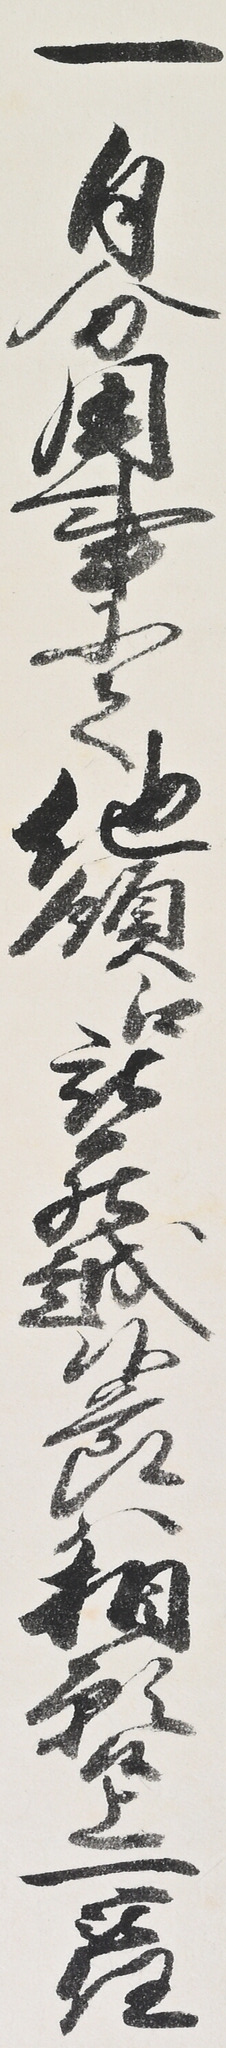一自分用事にて他領え被罷越候節ハ相願候上可被任
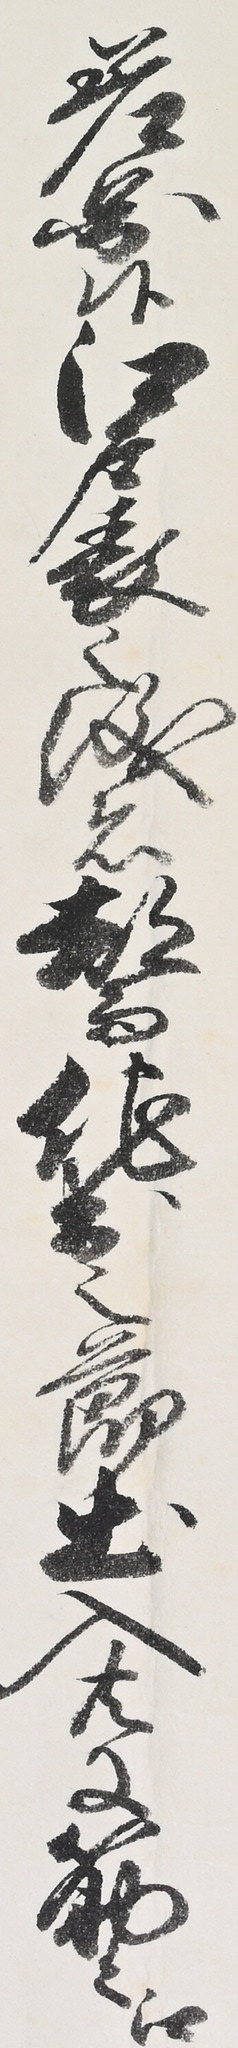差図候江戸表之儀者都而他出之節出入共に筋々え
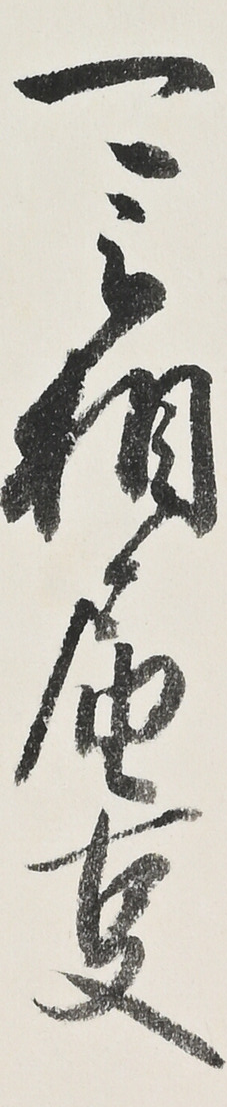可被相届事
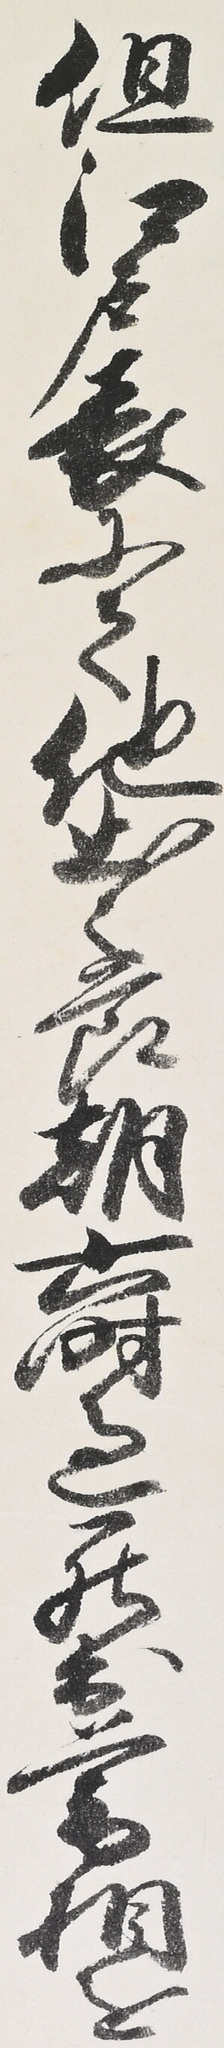但江戸表にて他出之節朝六時過罷出暮相を

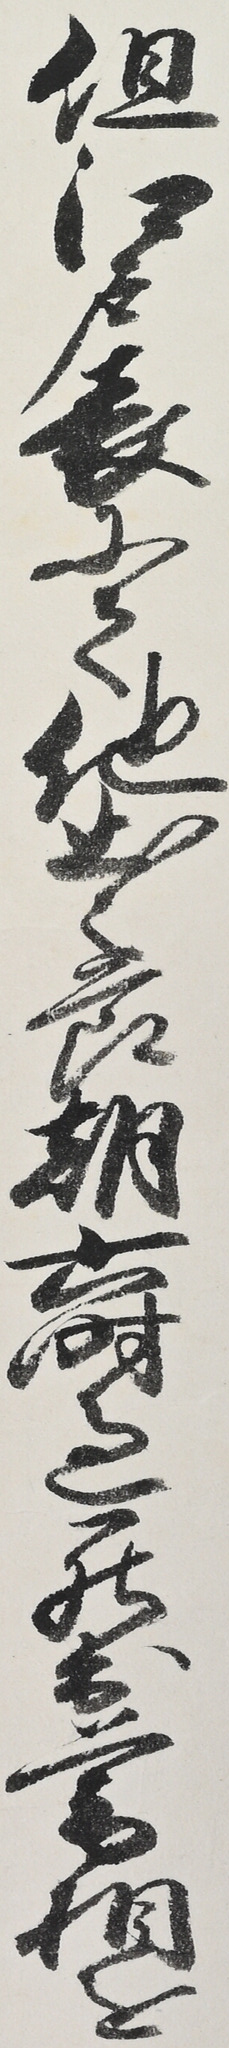但江戸表にて他出之節朝六時過罷出暮相を
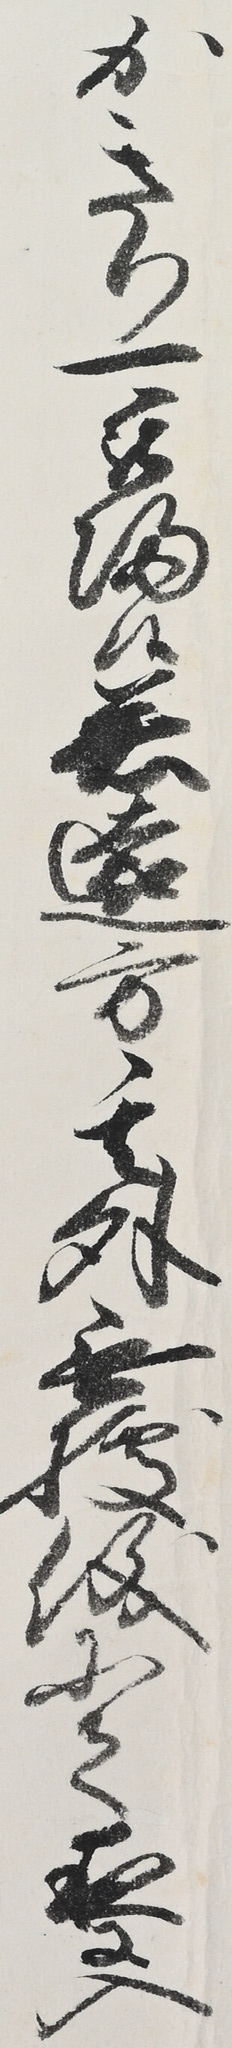かきり可被帰候若遠方其外無拠儀にて夜に入
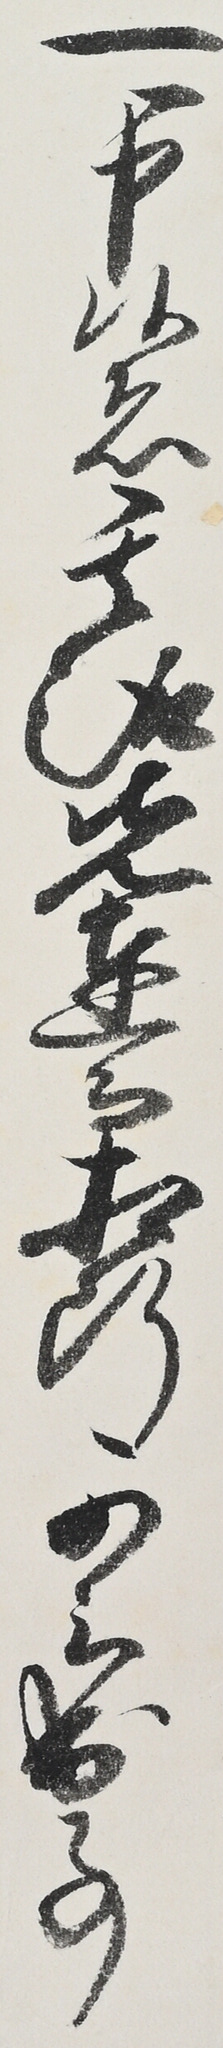可申候者其趣先達而相断可被出事
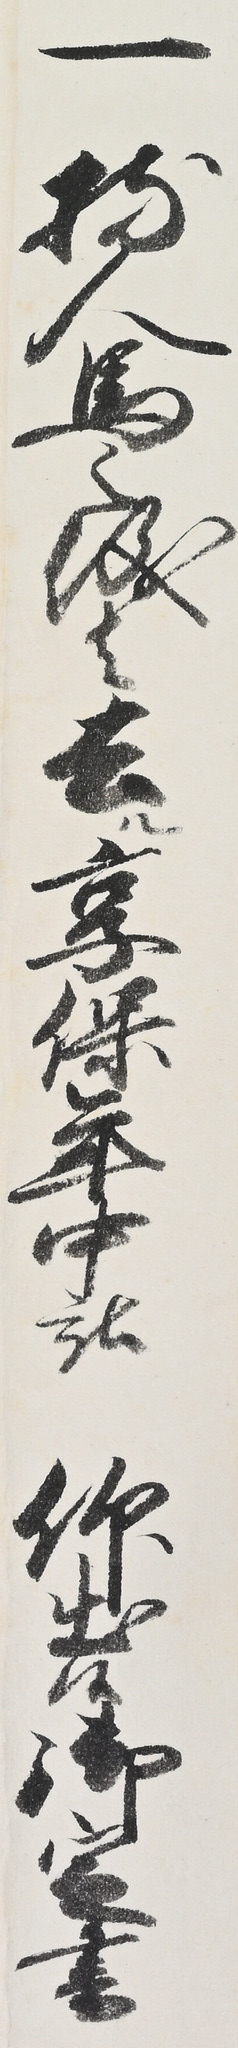一持人馬之儀者去ル享保年中被仰出候御定書
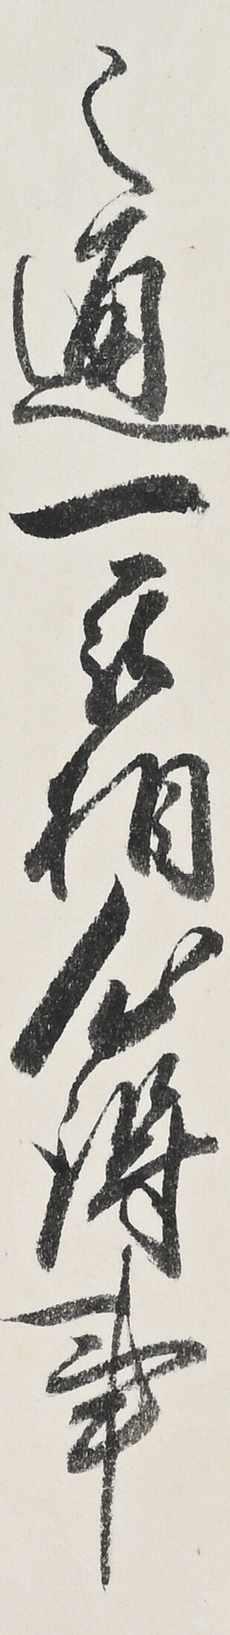之通可被相心得事
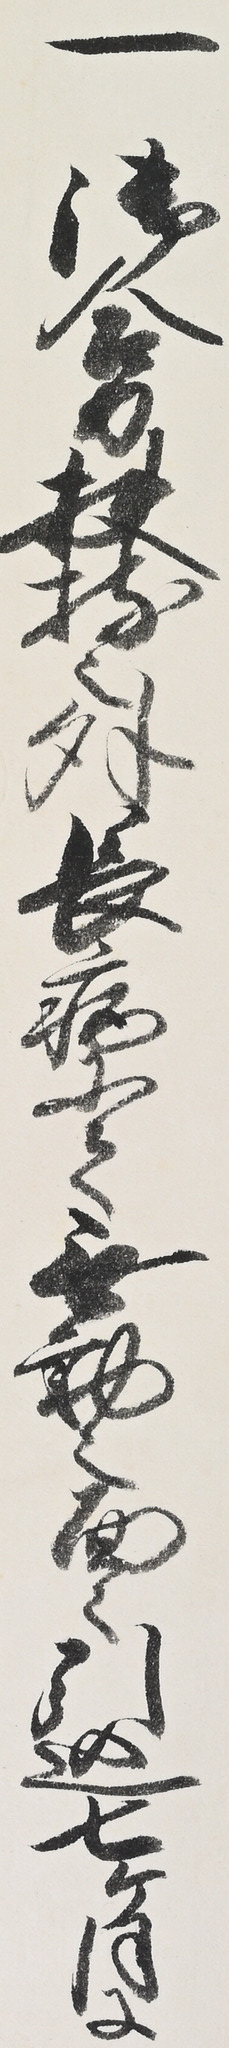一御合力扶持之外長病にて無勤之面々引込七ヶ月に
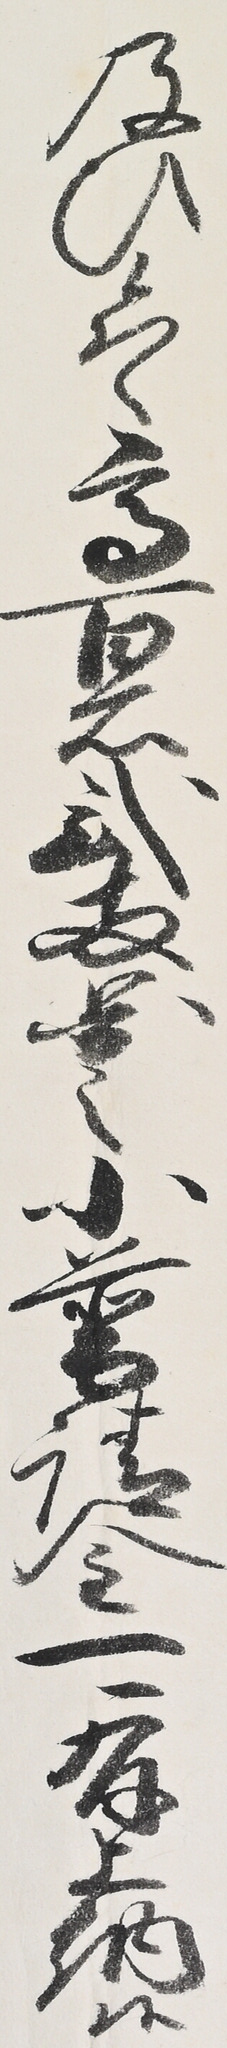及ひ候ハゝ高百石弐両図之小普請金可有上納候
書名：仰書覚
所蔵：伊那市立高遠町図書館・合同会社AMANE
